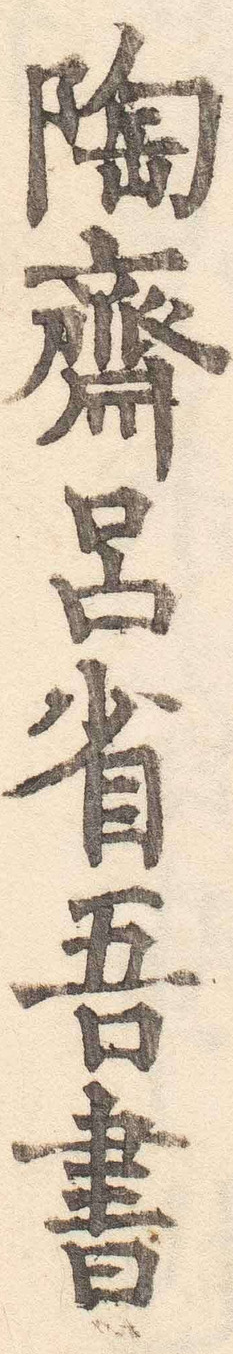陶齋呂省吾書
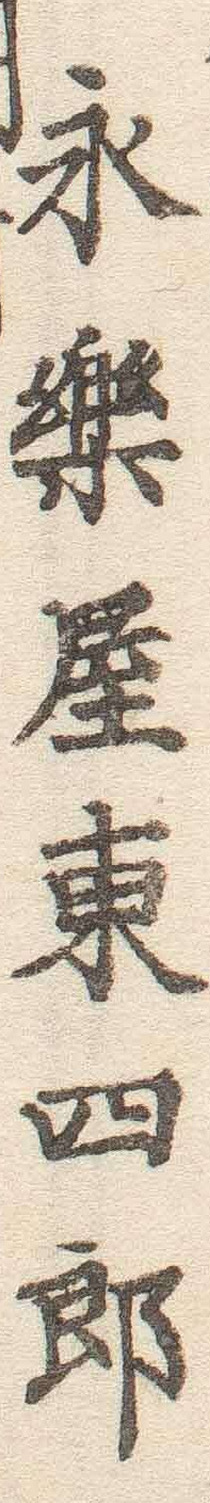永楽屋東四郎
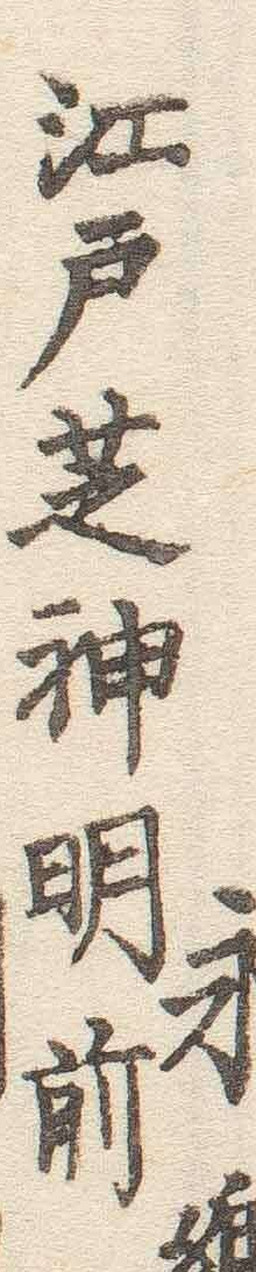江戸芝神明前
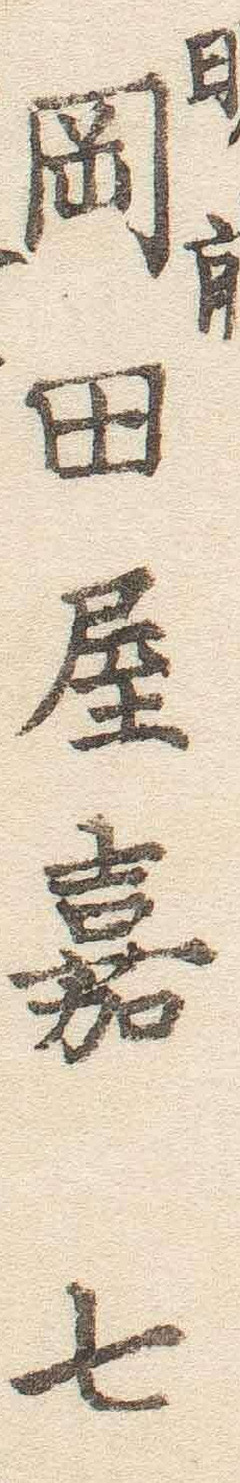岡田屋嘉七
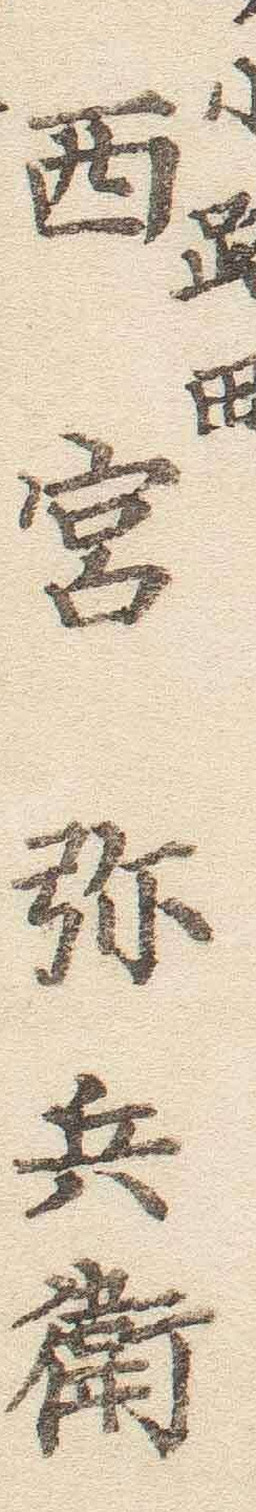西宮弥兵衛
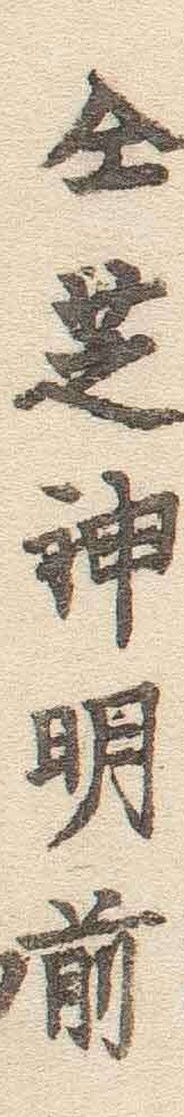仝芝神明前
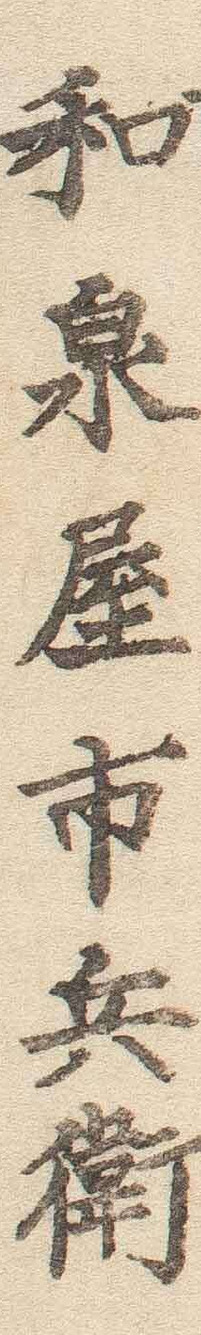和泉屋市兵衛

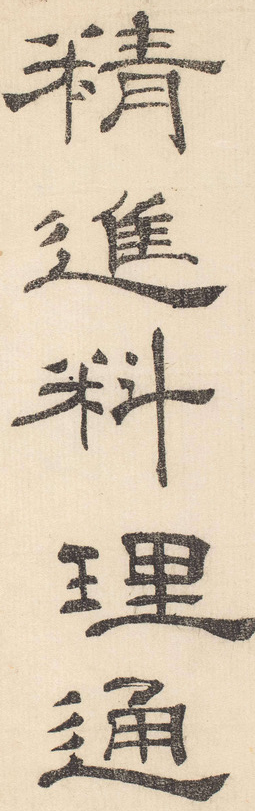精進料理通
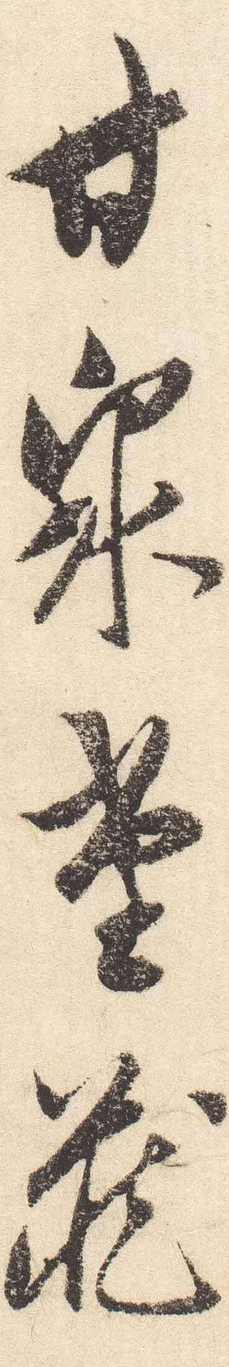甘泉堂蔵
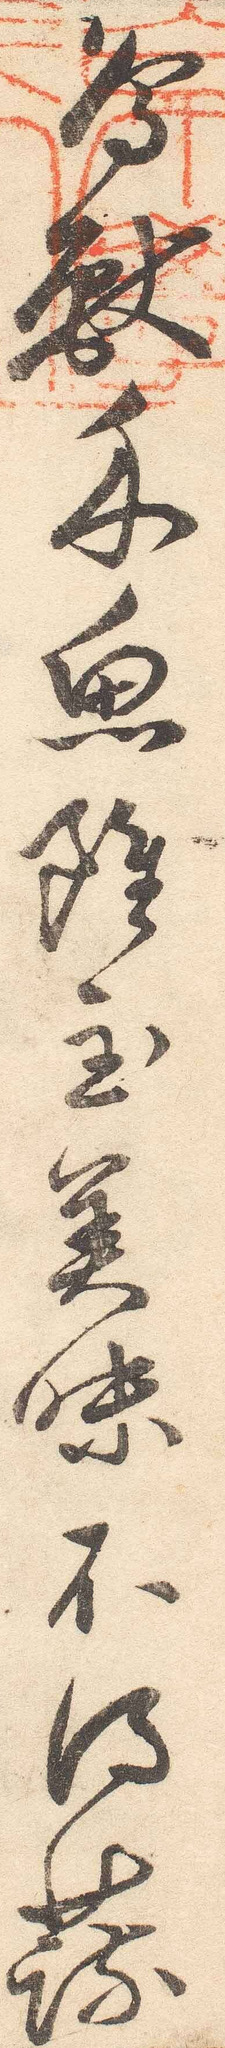鳥獣介魚雖至美味不得蔬
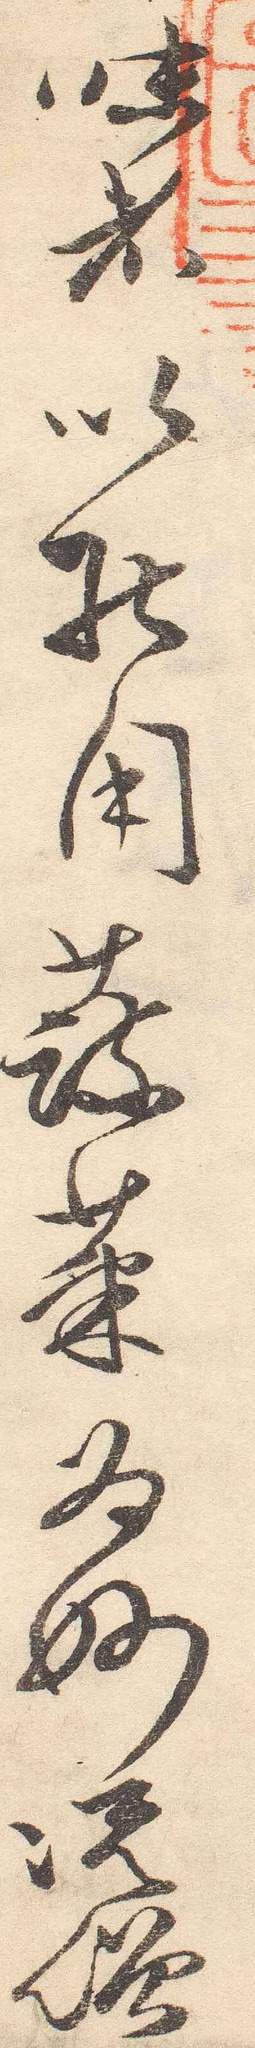味者以被用蔬菜為妙况僧
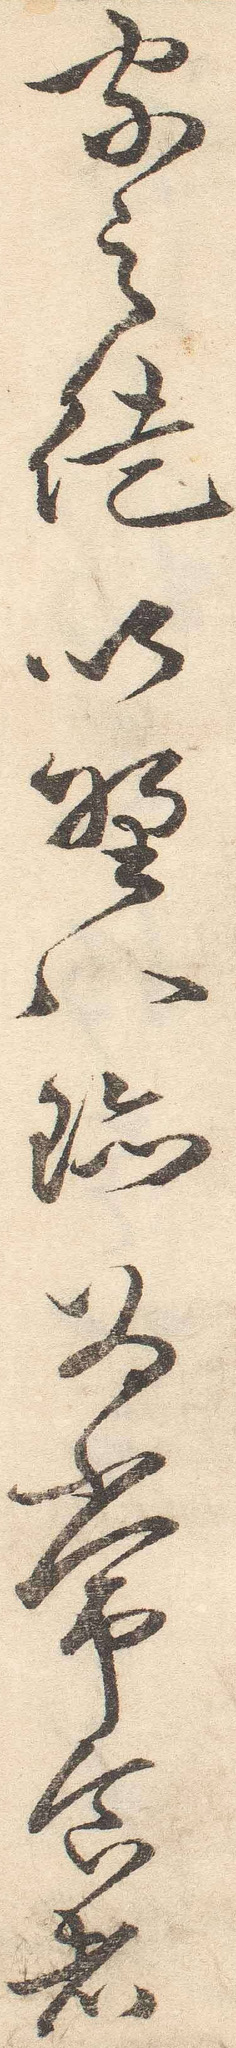家之徒以野八珍為常食者
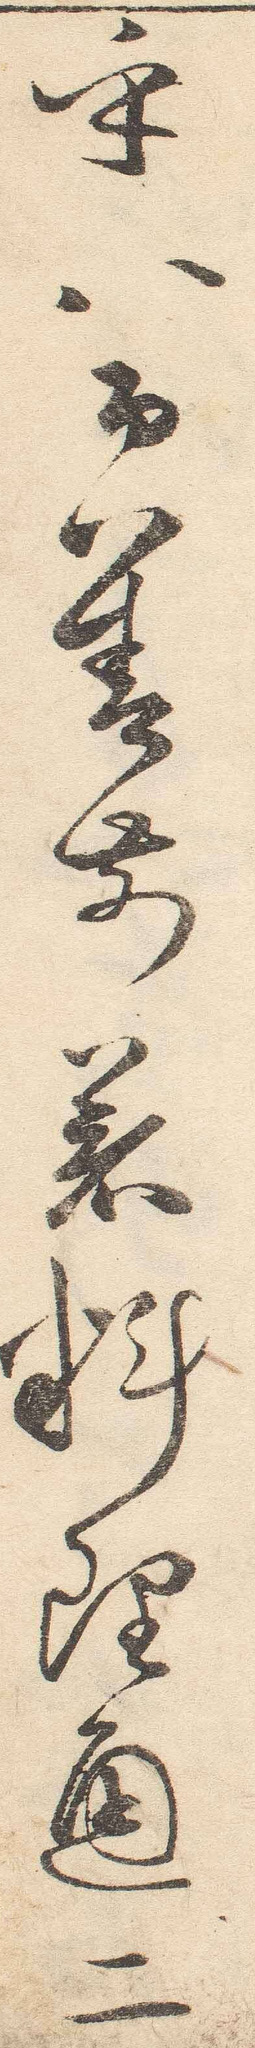乎八百善前著料理通二
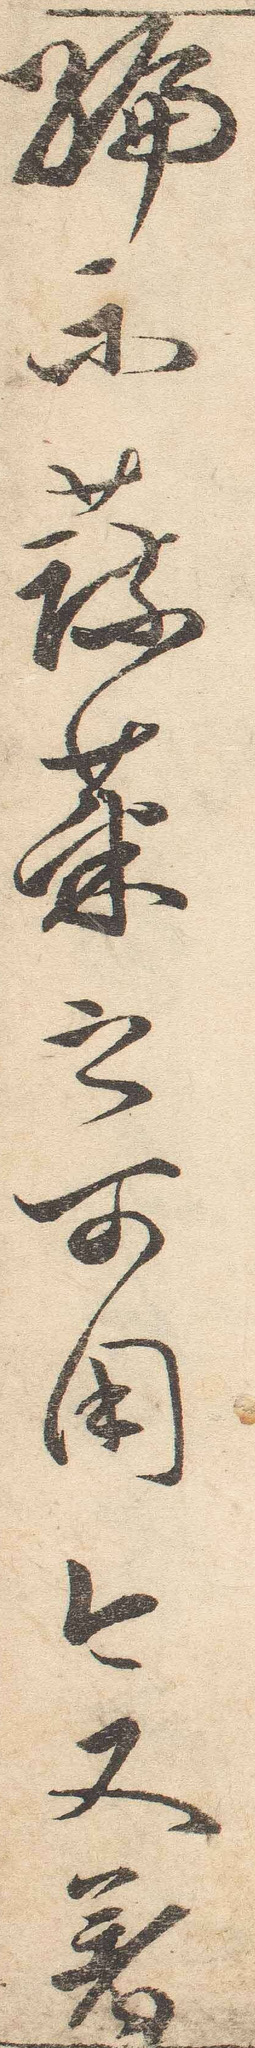編示蔬菜之可用今又著

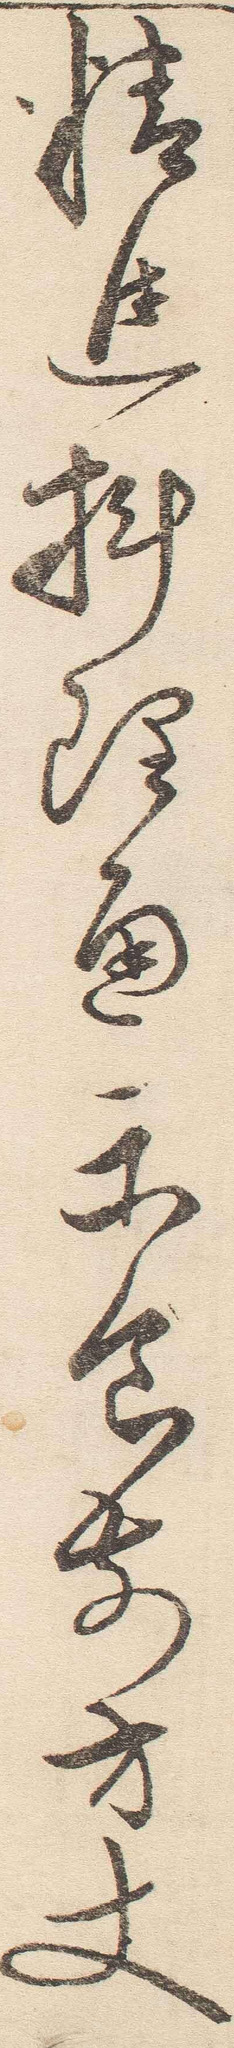精進料理通示食前方丈
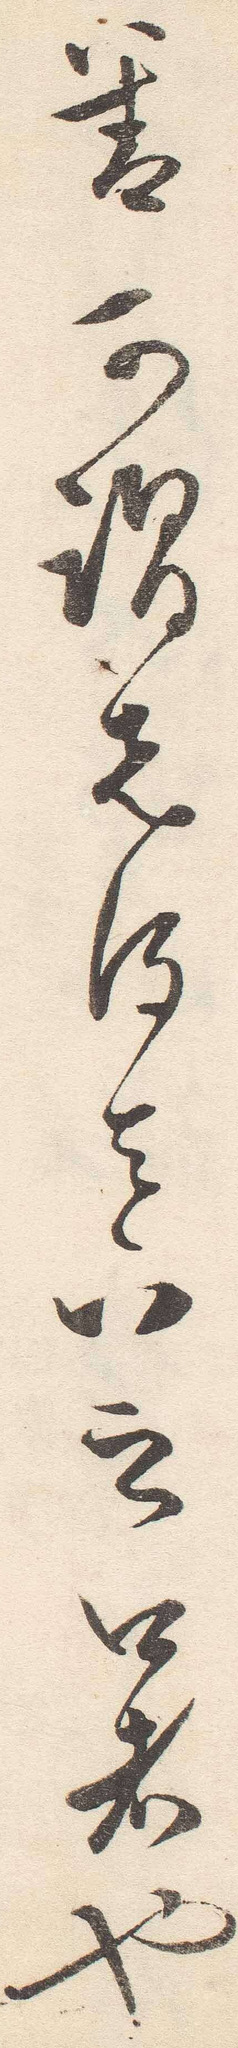善可謂先得真之口者也
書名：料理通
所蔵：東京学芸大学附属図書館 国文学研究資料館
